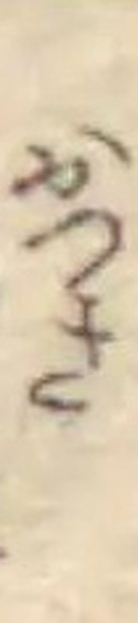おつき
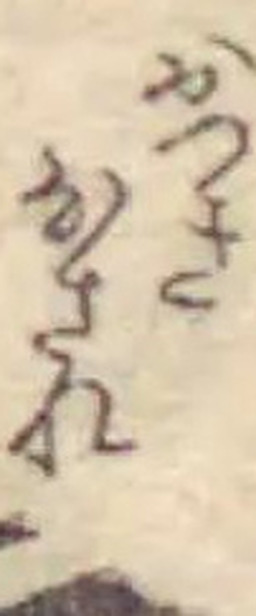なされ
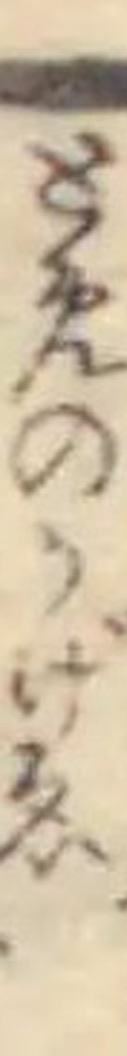とめのかげゑ
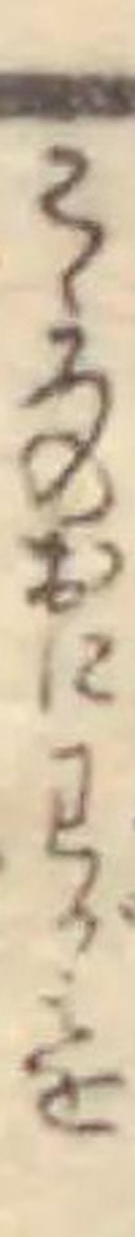こゝろのおにわがみを
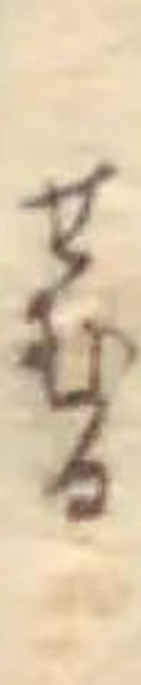せむる
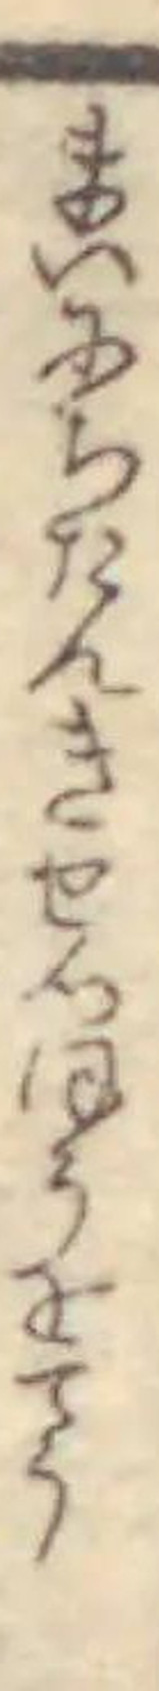まいにちたんきせつほうをてう
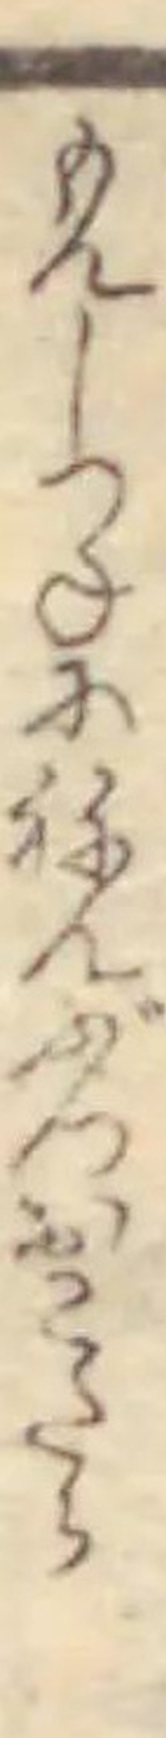もんしつねにねんぶつおこたら
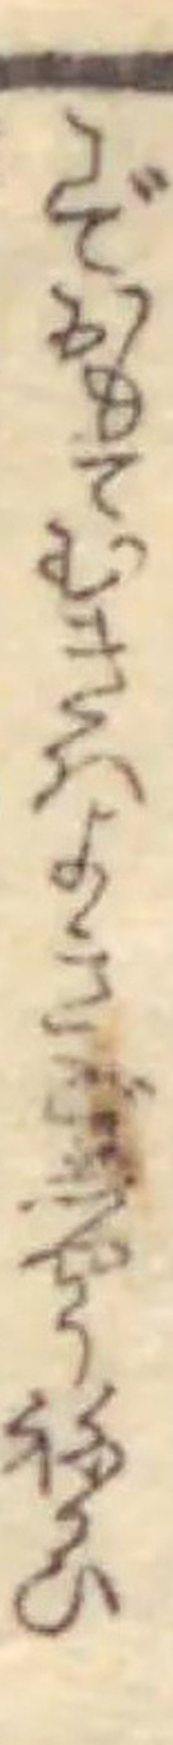ずおもてむきはよきごしやうねかひ
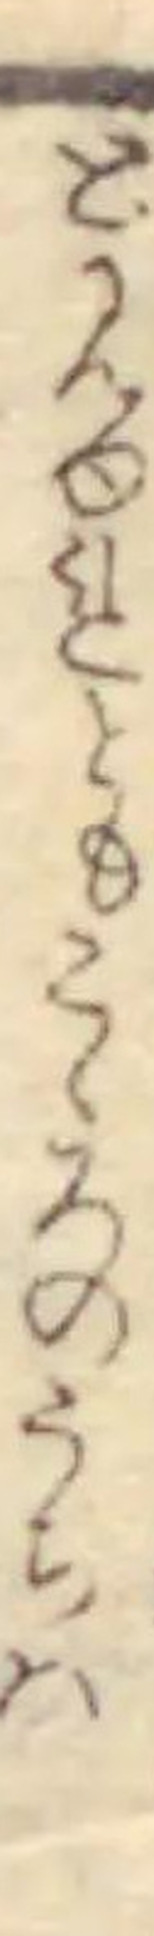と見ゆれともこゝろのうちは
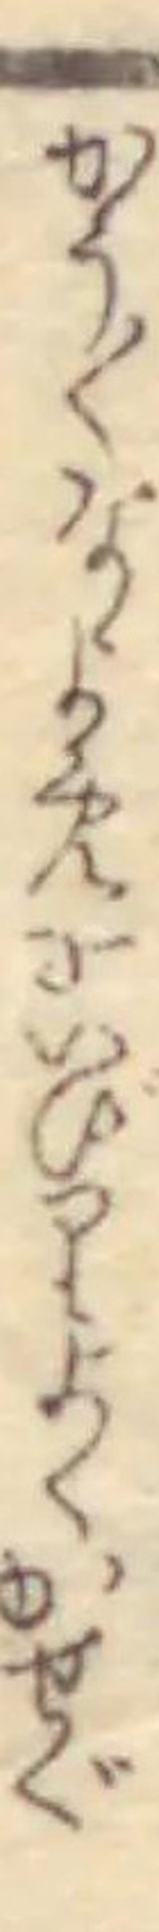かう〳〵なよめをいびりよくかせぐ
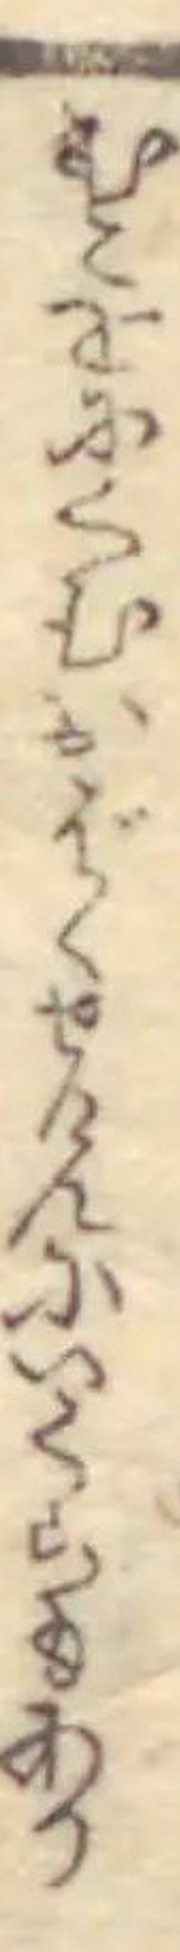むこをにくむおばゝせけんにいくらもあり
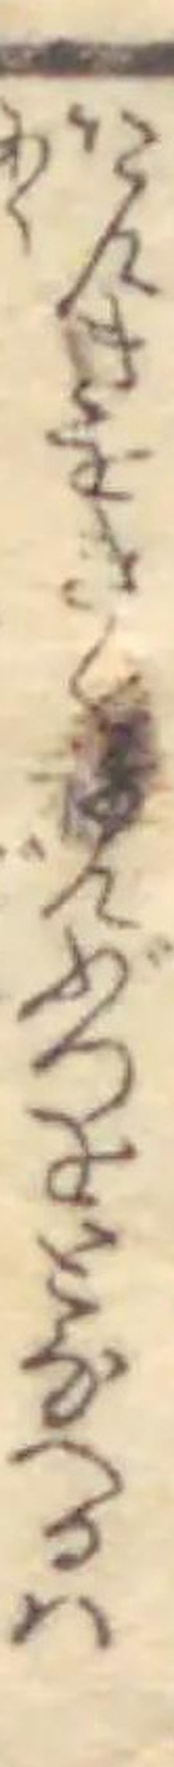たんきをきゝねんぶつをとなへるは
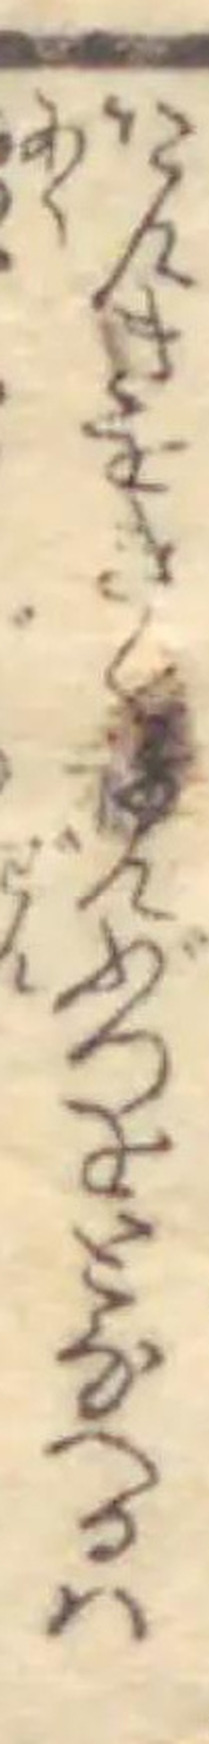たんきをきゝねんぶつをとなへるは
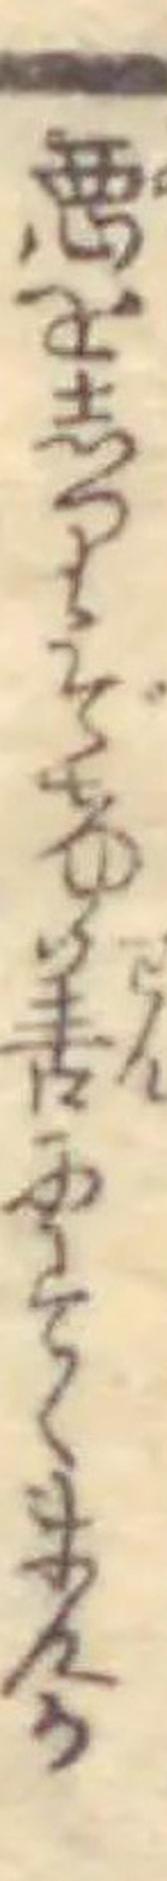悪をしりぞけ善にすゝまんか
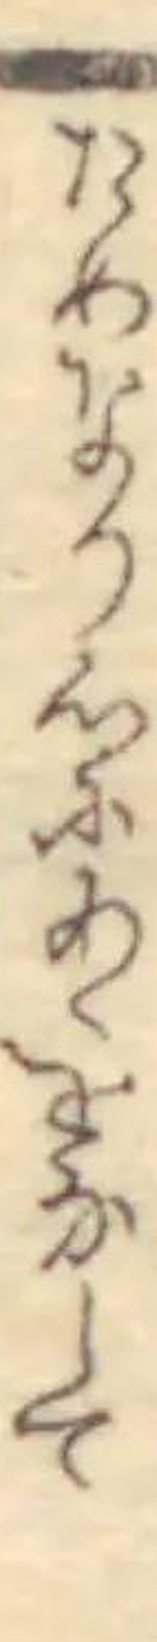ためなり心にあくをなして
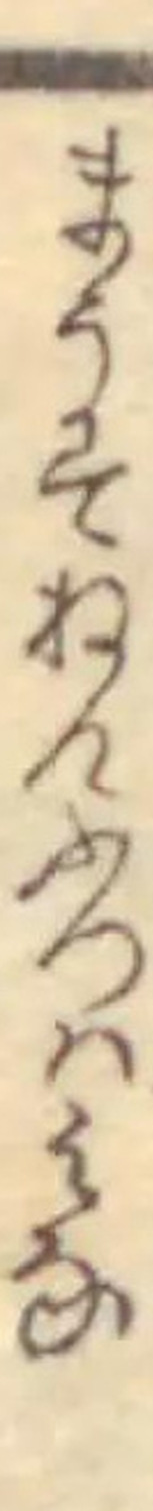まうすねんふつははな
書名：児訓影絵喩 3巻
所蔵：国立国会図書館 National Diet Library, JAPAN
